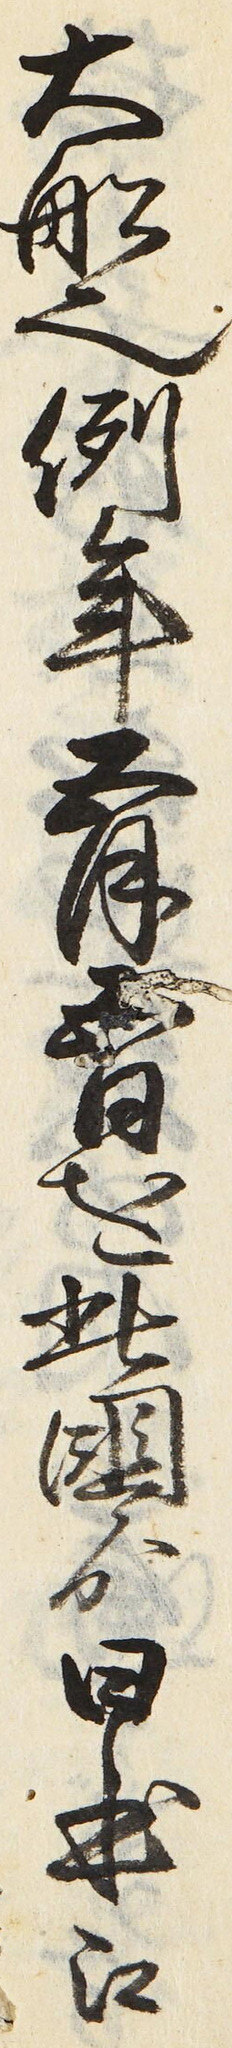大船也例年五月五日を此国ゟ日本江
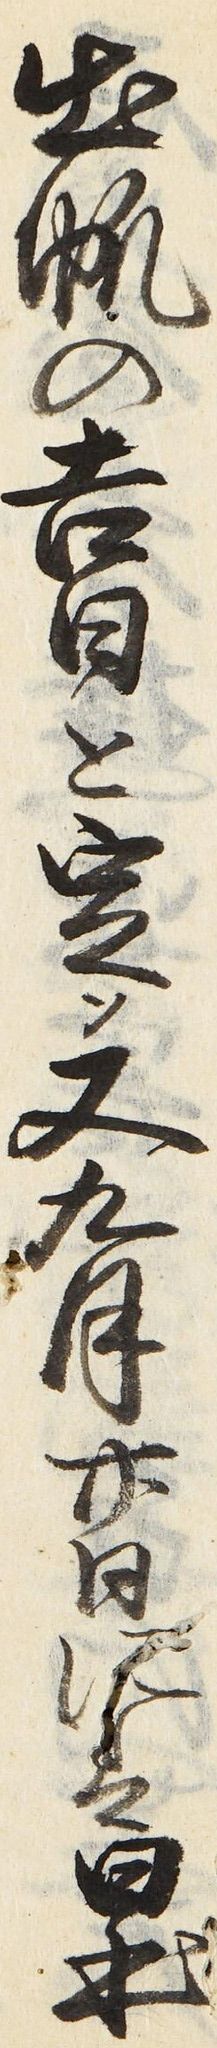出帆の吉日と定め又九月廿日には日本
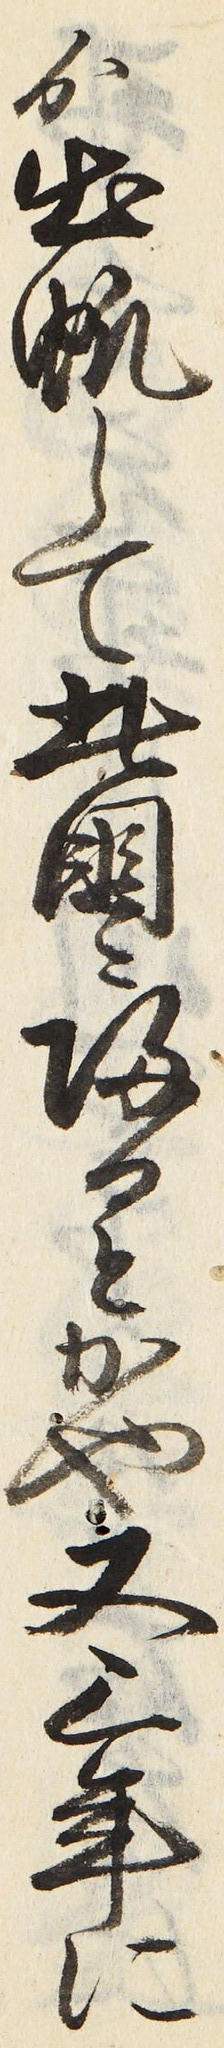ゟ出帆して此国に帰るとかや又三年に
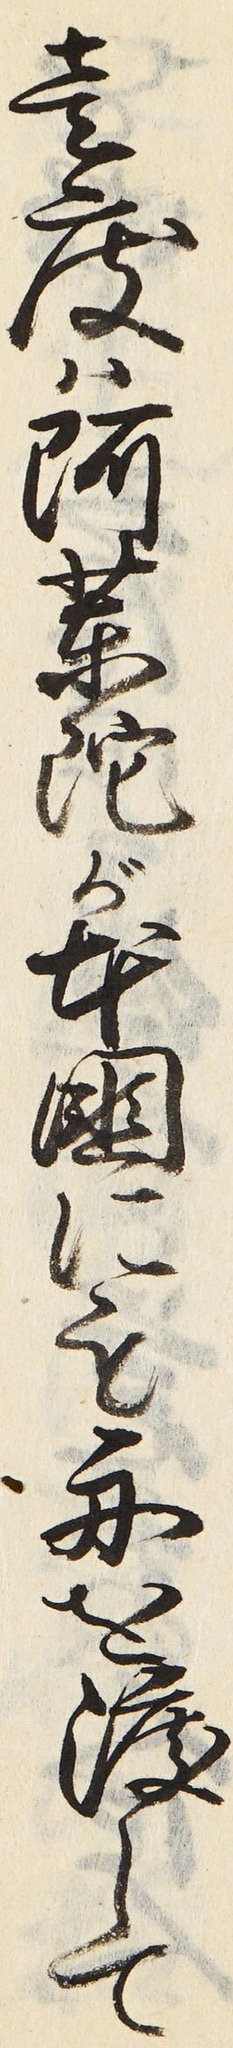壱度は阿蘭陀が本国にも舟を渡して
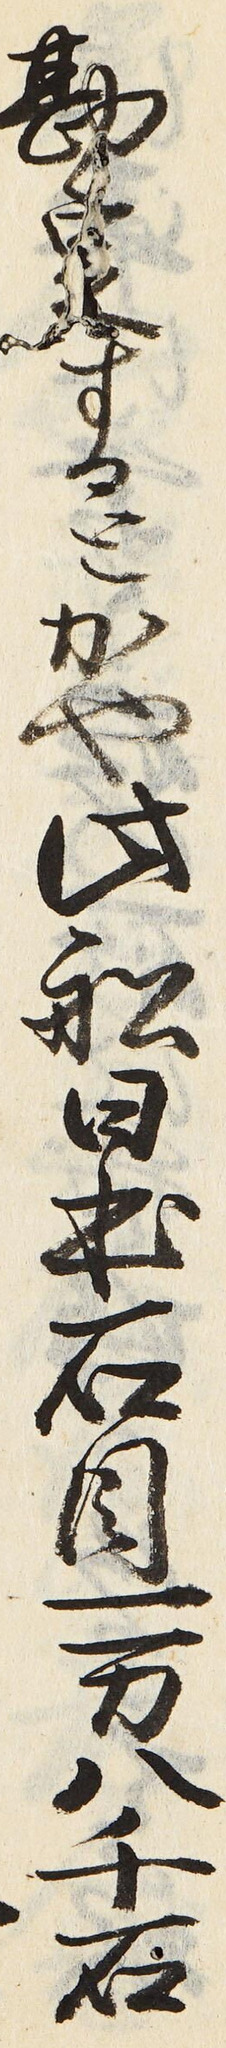勘定するとかや此船日本石目一万八千石
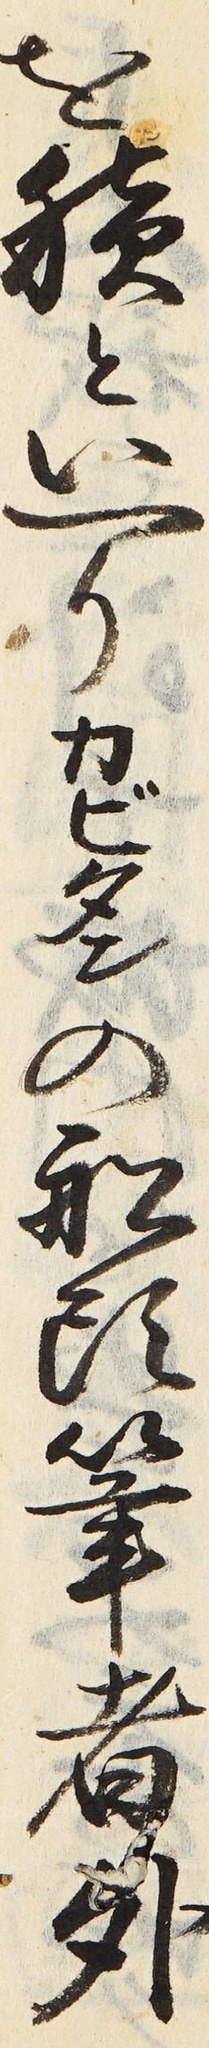を積といへりカビタンの船頭筆者外
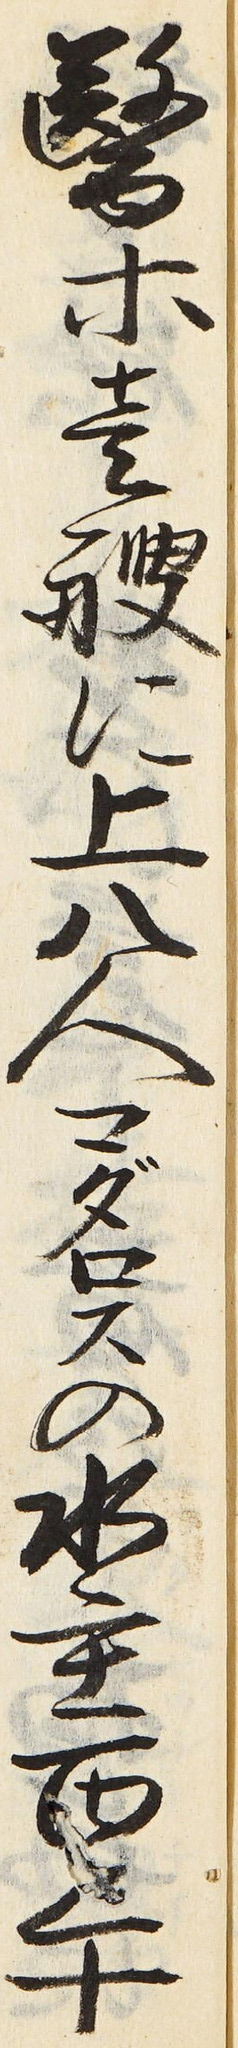医等壱艘に上八人マダロスの水主百三十
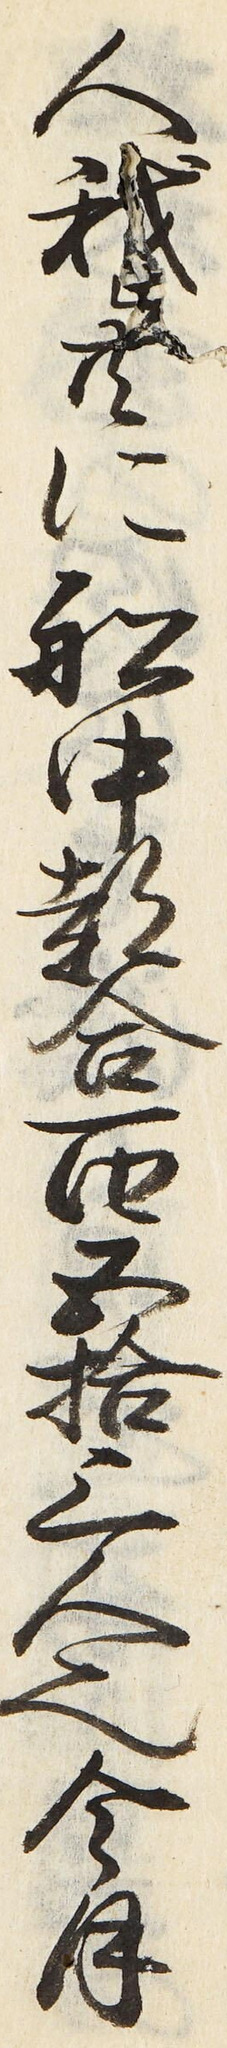人我れ共に船中都合百五拾三人也今月
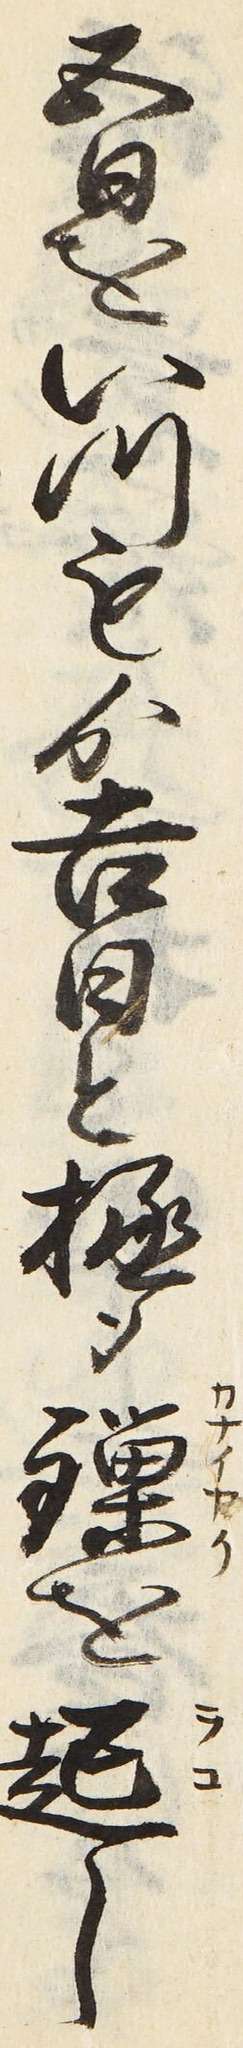五日をいつもゟ吉日と極め鏁を起し
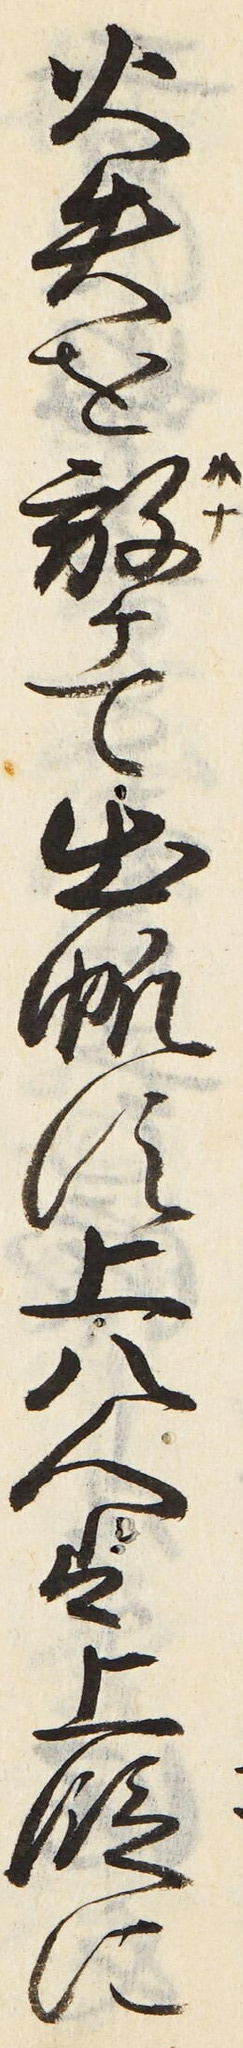火矢を放ちて出帆す上八人は上段に
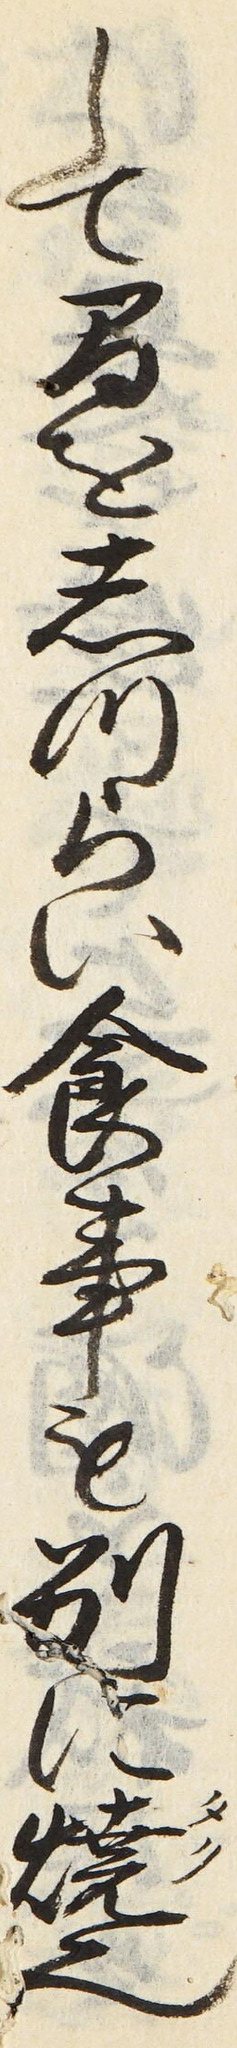して間をしつらい食事も別に焼也
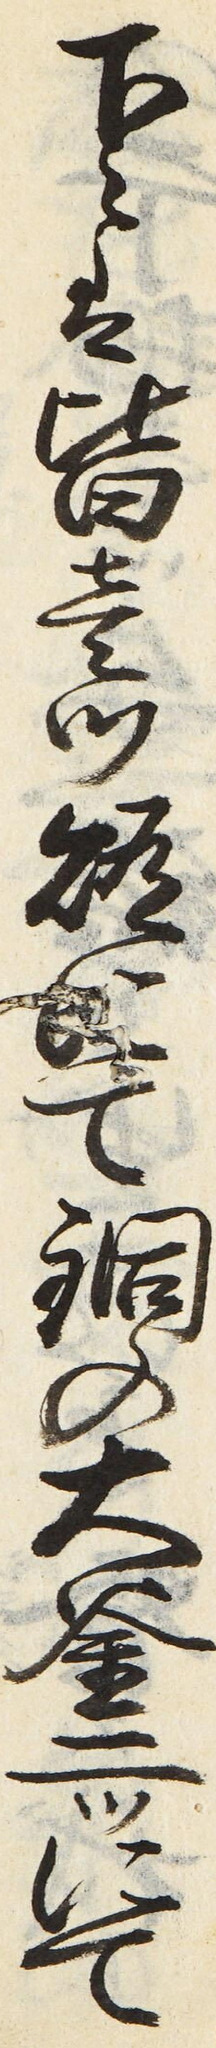下々は皆壱ツ賄にて銅の大釜二ツにて
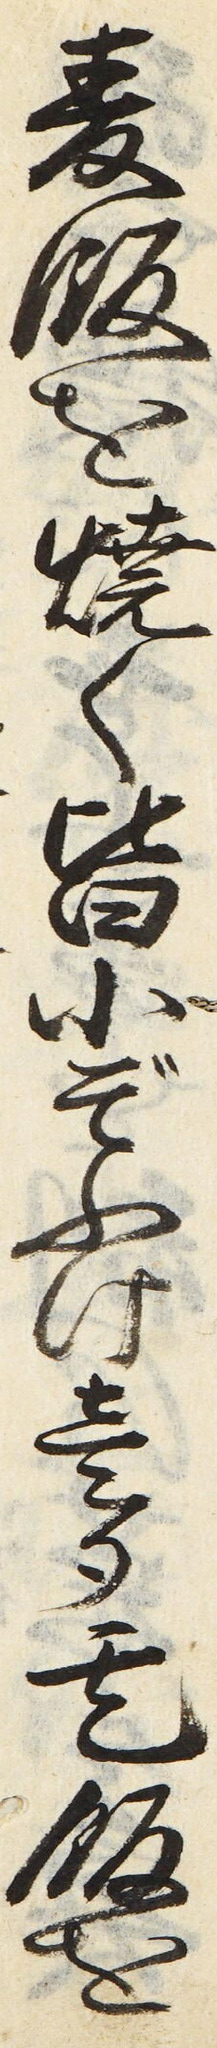麦飯を焼く皆小ぞふけ壱夕其飯を
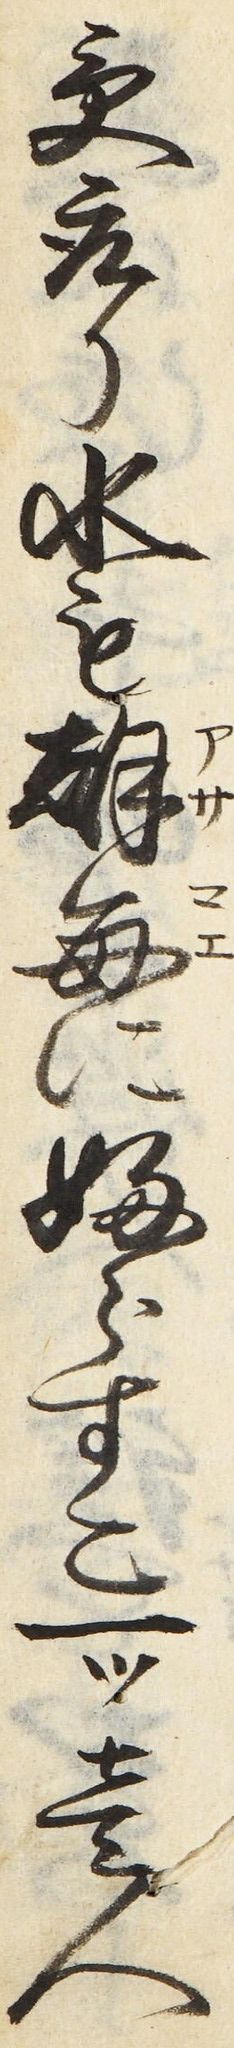受取り水も朝毎にふらすこ一ツ壱人

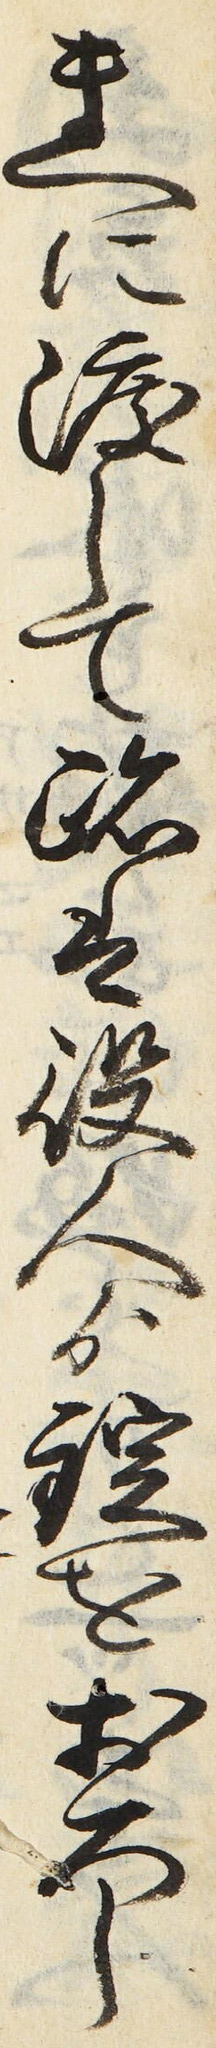まへに渡して跡は役人ゟ錠をおろし
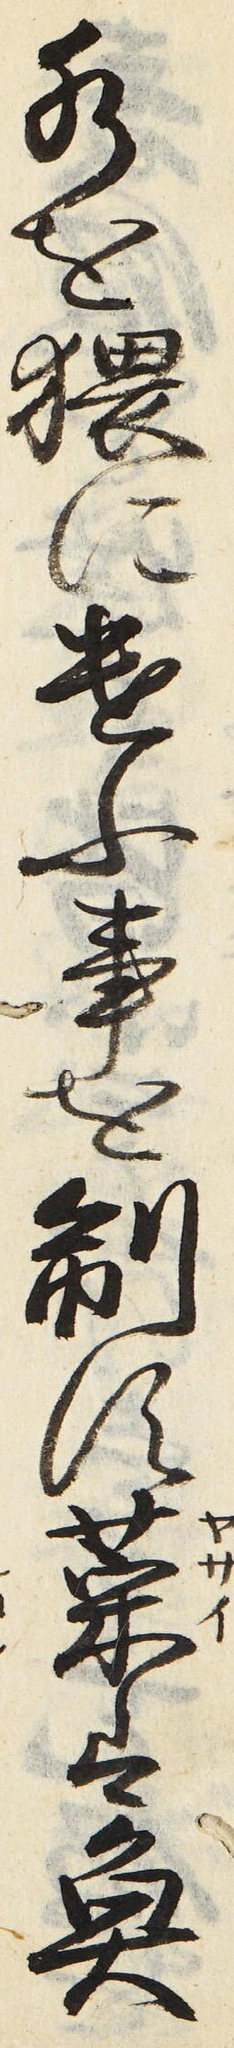水を猥に遣ふ事を制す菜は魚
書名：華夷九年録
